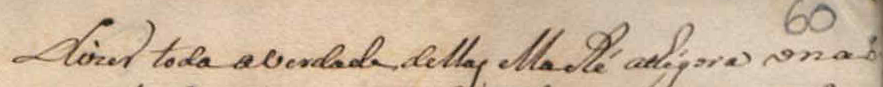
Dizer toda a verdade dellas, ella Ré athé gora o naõ
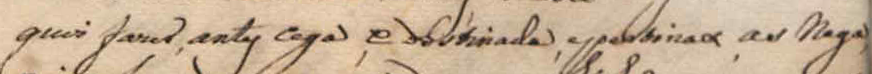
quis fazer, antes cega, e obstinada, e pertinax as Nega,
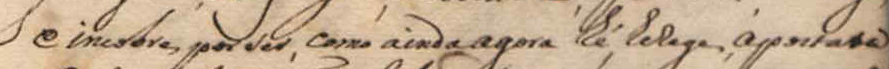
e incobre, por ser, como ainda agora hé, heRege, apostata
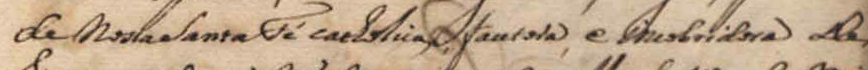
de Nossa Santa Fé catholica, fautosa, e incobridora De
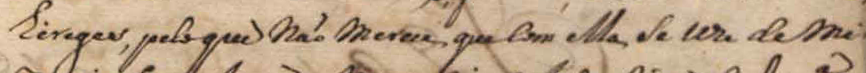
hereges, pelo que naõ merece que com ella se uze de mi
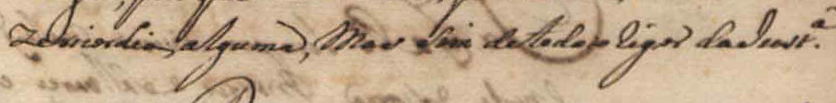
zericordia alguma, Mas sim de todo o Rigor da Iust.a
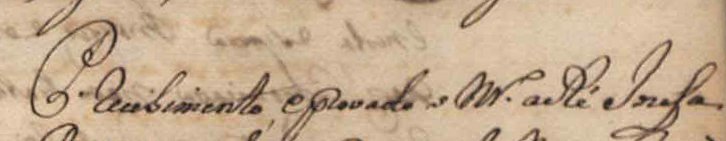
P. Recebimento e pRovado o Nr.o a Ré Iozefa
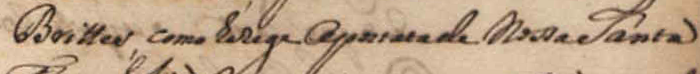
Brittes, como heRege apostata de Nossa Santa
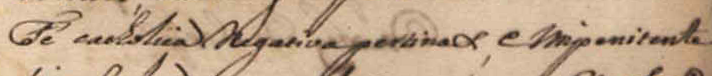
Fé catholica Negativa pertinax, e impenitente
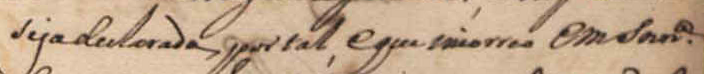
seja declarada, por tal e que incorreo em Snn.a
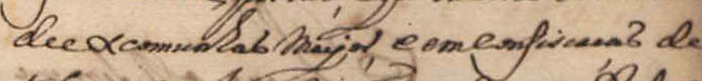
de excomunhaõ Mayor, e em confiscaçaõ de
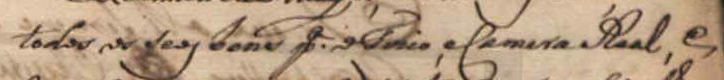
todos as seos bens p.a o Fisco, e Camera Real, e,
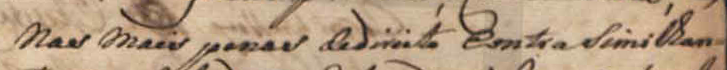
nas mais penas de direito Contra similhan
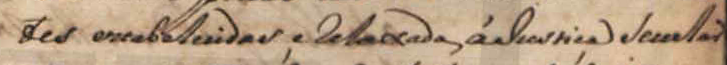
tes estabelecidas, e Relaxada, á Iustiça secular
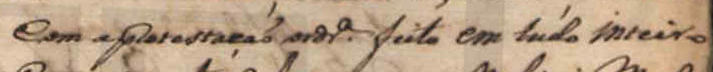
Com a pRotestaçaõ ordr.a feito em tudo inteiro
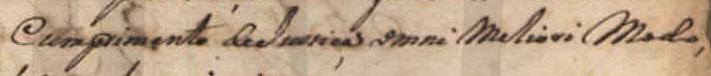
Cumprimento de Iustiça omni Meliori Modo,
